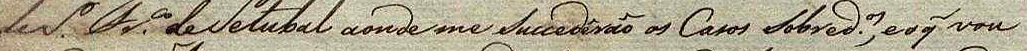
de S. Fr.co de Setubal aonde me succedêraõ os Casos sobred.os, e q̄ vou
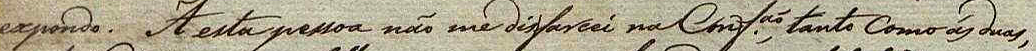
expondo. Ã esta pessoa naõ me disfarcei na Conf.aõ, tanto como ás duas,
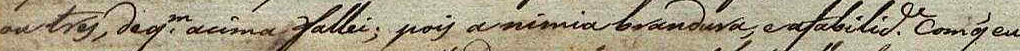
ou tres, de q.m acima fallei; pois a nimia brandura, e afabilid.e com q̄ eu
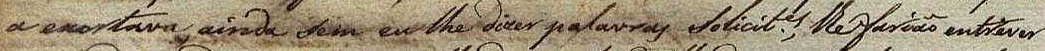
a exortava, ainda sem eu lhe dizer palavras solicit.es, lhe fariaõ entrever
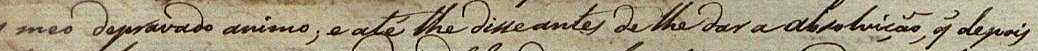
o meo depravado animo, e até lhe disse antes de lhe dar a absolviçaõ, q̄ depois
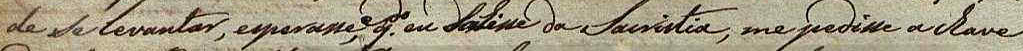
de se levantar, esperasse e q.do eu sahisse da Sacristia, me pedisse a chave
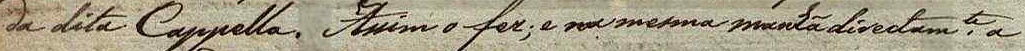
da dita Cappella. Assim o fez; e na mesma manhã directam.te a
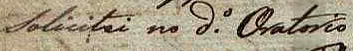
solicitei no d.o Oratorio.
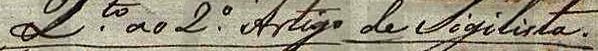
Q.to ao 2º Artigo de Sigilista.
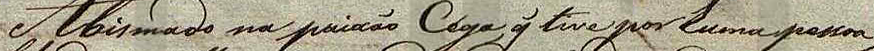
Abismado na paixaõ Céga q̄ tive por huma pessoa,
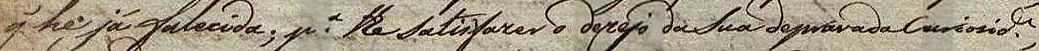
q̄ he já falecida; p.a lhe satisfazer o dezejo da sua depravada curiozid.e,
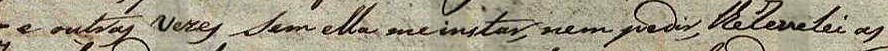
e outras vezes sem ella me instar, nem pedir, lhe revelei as
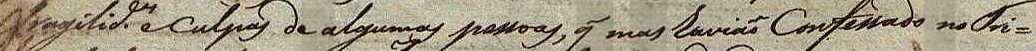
fragilid.es e culpas de algumas pessoas, q̄ mas haviaõ confessado no Tri
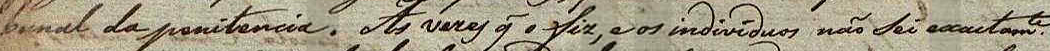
bunal da penitencia. As vezes q̄ o fiz, e os individuos naõ sei exactam.te
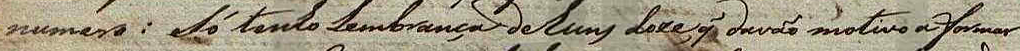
o numero: só tenho lembrança de huns doze, q̄ davaõ motivo a formar
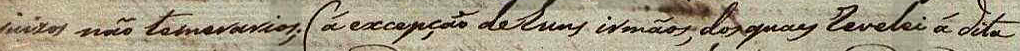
juizos naõ temerarios; (á excepçaõ de huns irmaõs, dos quaes revelei á dita
